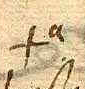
ta.
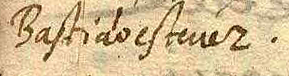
Bastião esteuēz.
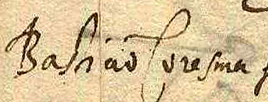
Bastiaõ Coresma
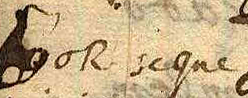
q̄ o R. se que
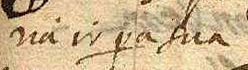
ria ir ꝑa sua
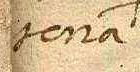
terra
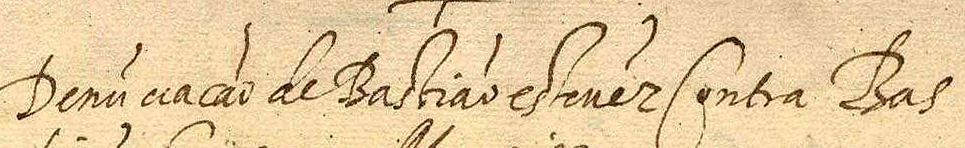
Denūciacão de Bastiaõ esteuēz Contra Bas
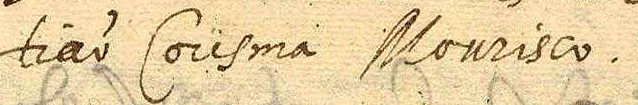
tiaõ Coresma Mourisco.
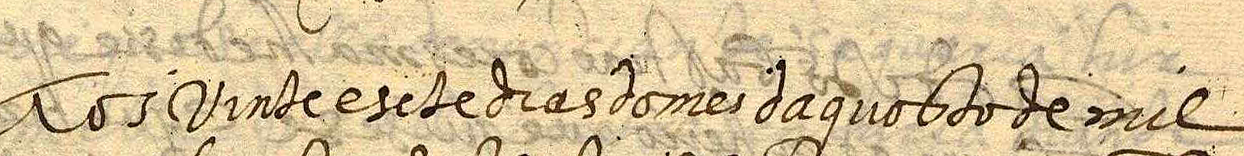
Aos vinte e sete dias do mes daguosto de mil
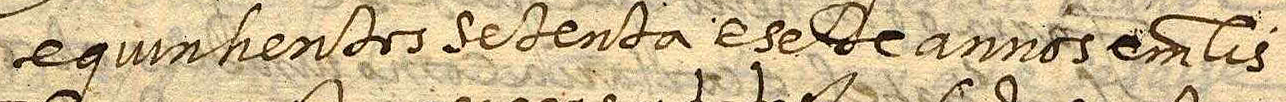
e quinhentos setenta e sete annos em lis
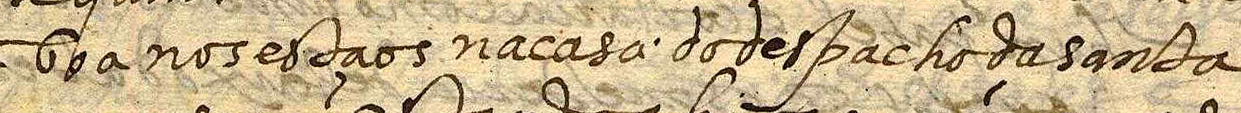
boa nos estaos na casa do despacho da santa
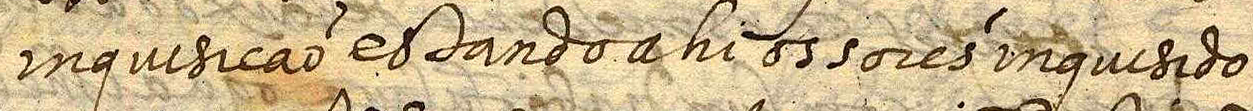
inquisicaõ estando ahi os sores̄ inquisido
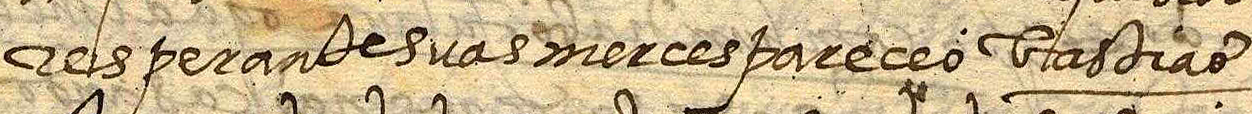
res perante suas merces pareçeo bastiaõ
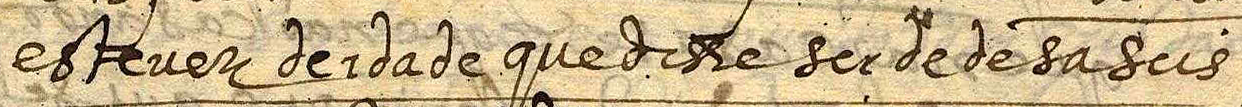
esteuez de idade que disse ser de desaseis
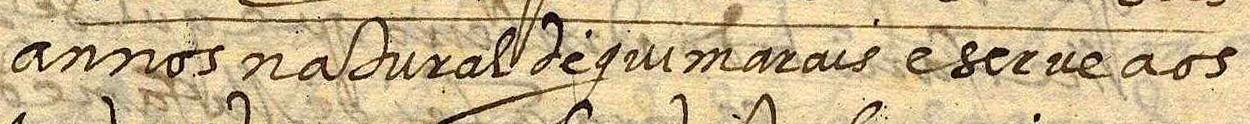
annos natural de guimarais e serue aos
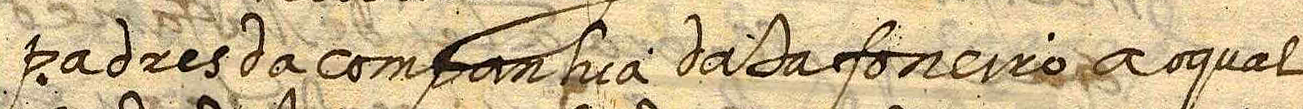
padres da companhia datafoneiro ao qual
